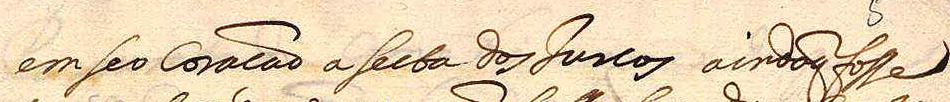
em seo coraçaõ a secta dos turcos aindo q̄ fosse
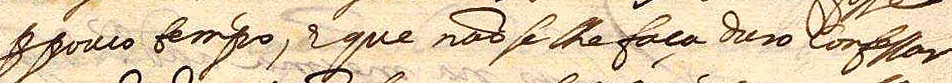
ꝑ pouco tempo, E que não se lhe faça duro confessar
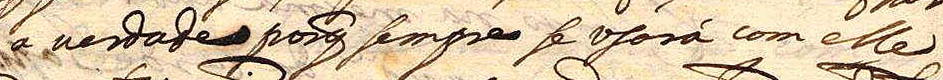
a uerdade porq̄ sempre se usará com elle
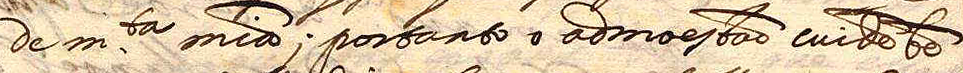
de mta mīa; portanto o admoestão cuidē bē
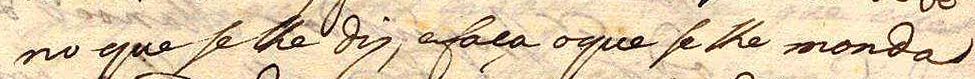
no que se lhe diz, e faça o que se lhe manda
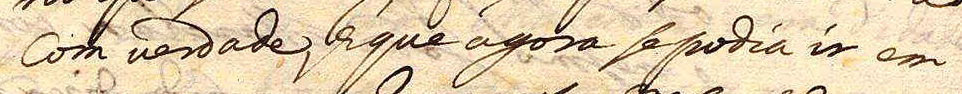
com uerdade, E que agora se podia ir em
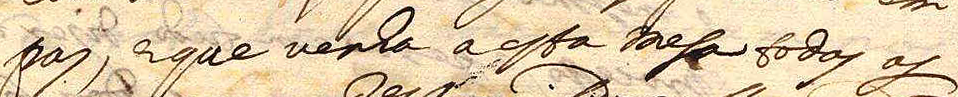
paz, E que uenha a esta mesa todas as
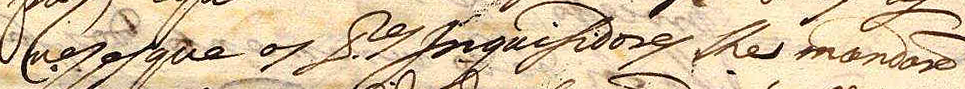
uezes que os s.res Jnquisidores lhe mandarē
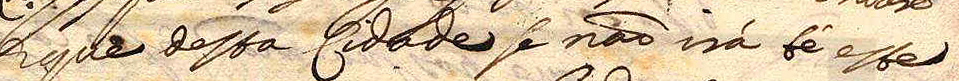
E que desta Cidade se não irá té este
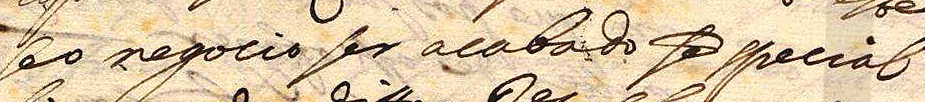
seo negocio ser acabado sē special
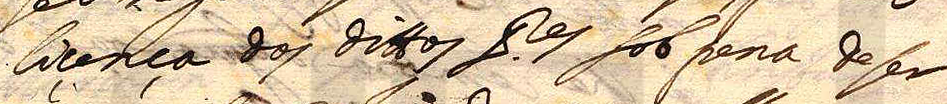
licença dos dittos s.res sob pena de ser
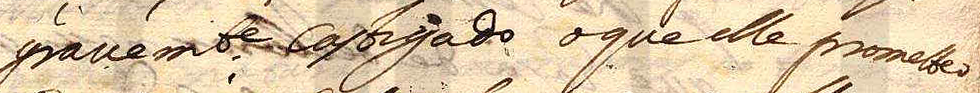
grauemt.e castigado o que elle prometteo
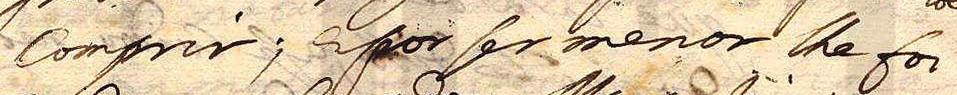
comprir; E por ser menor lhe foi
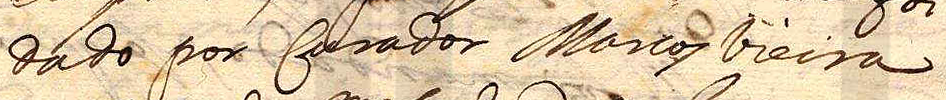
dado por Curador Marcos Vieira
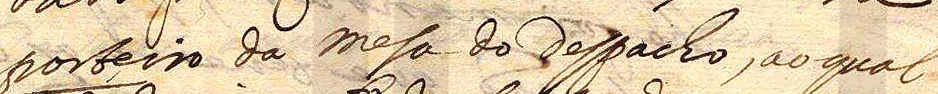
porteiro da mesa do despacho, ao qual
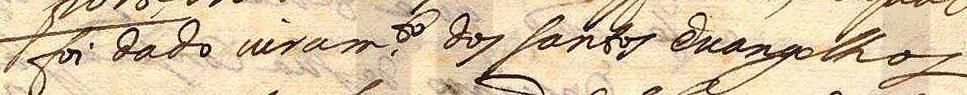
foi dado iuramto dos santos euangelhos
